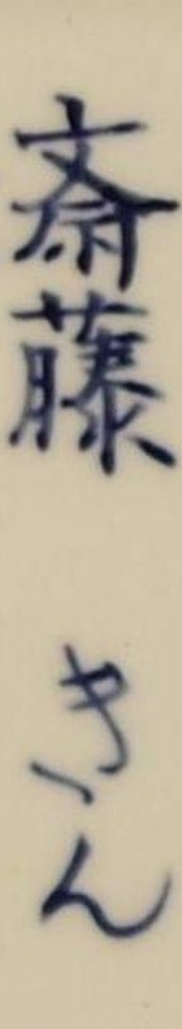斎藤きん
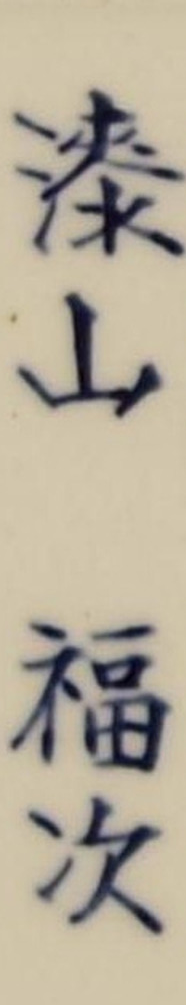湊山福次
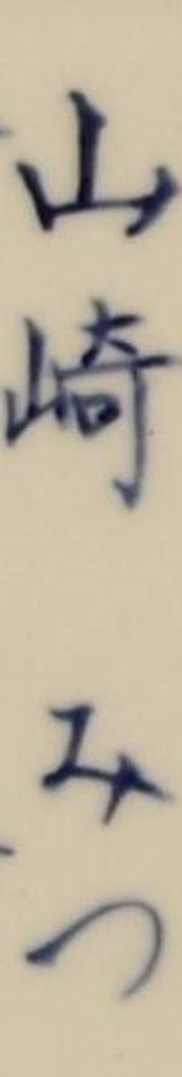山崎みつ
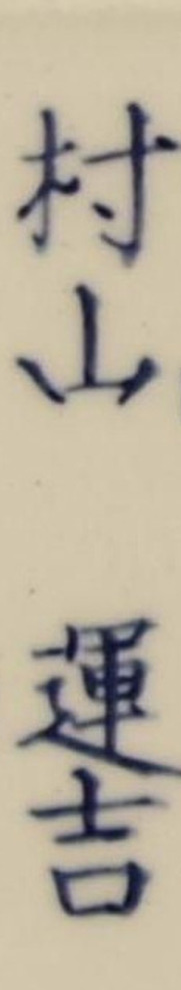村山運吉
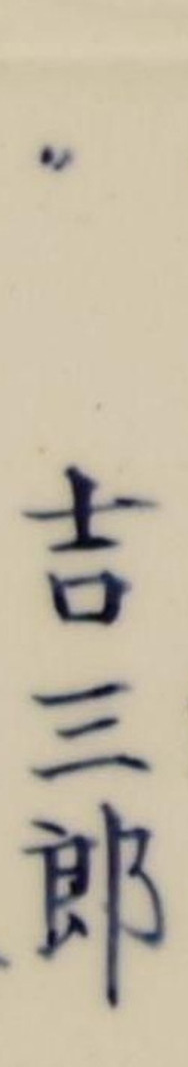吉三郎
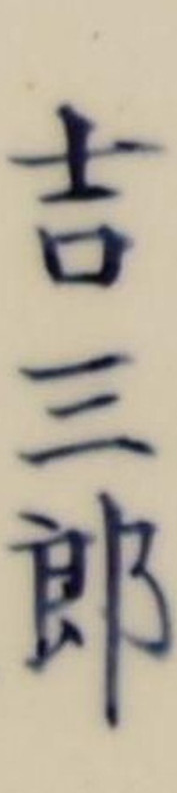吉三郎
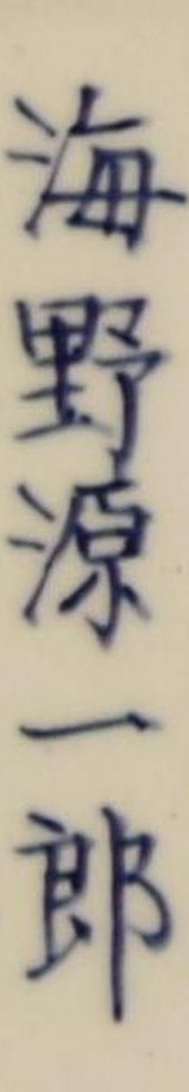海野源一郎
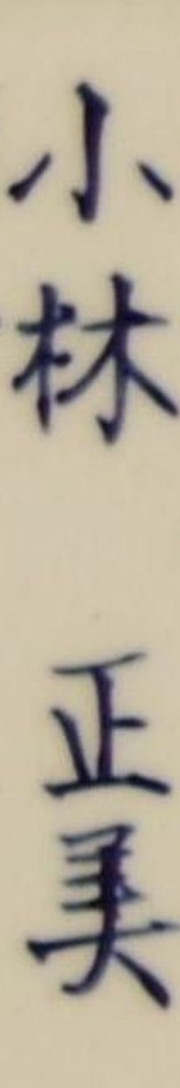小林正美
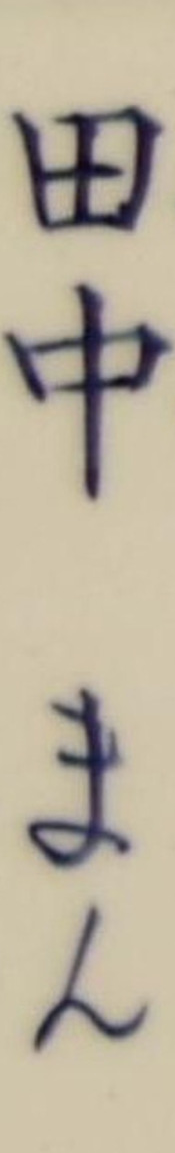田中まん
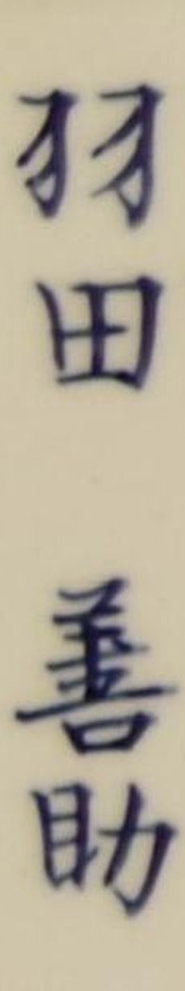羽田善助

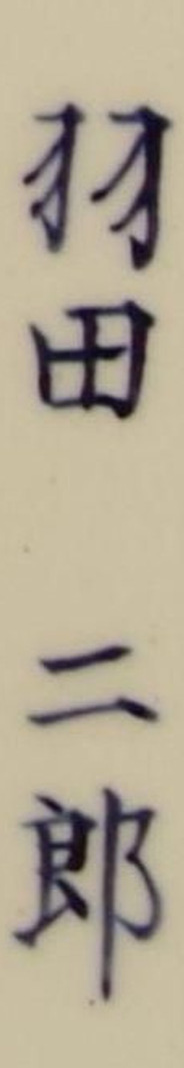羽田二郎
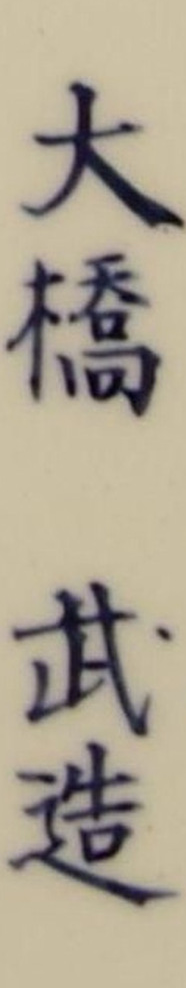大橋武造
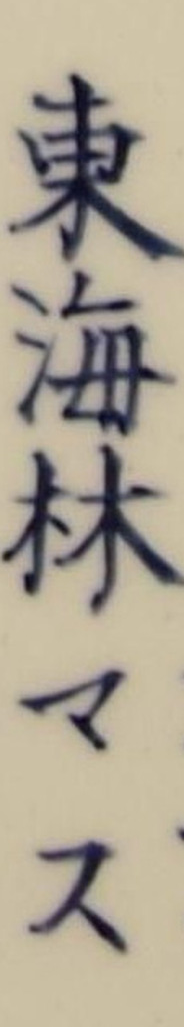東海林マス
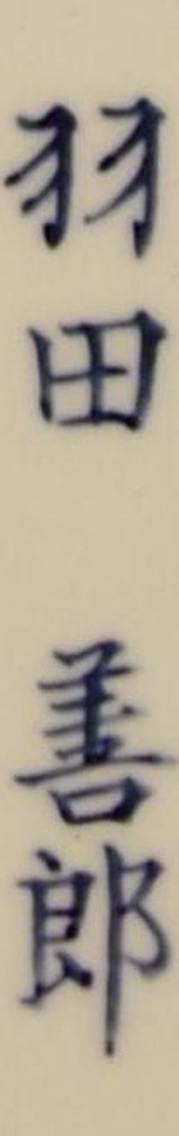羽田善郎
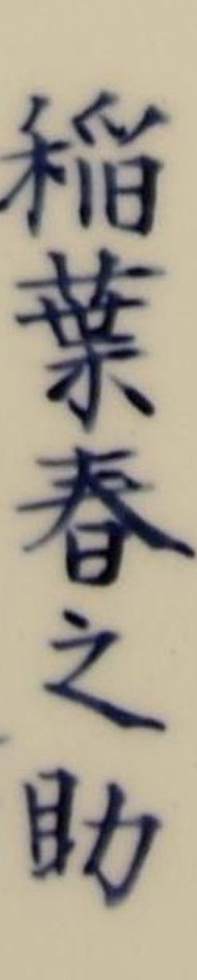稲葉春之助
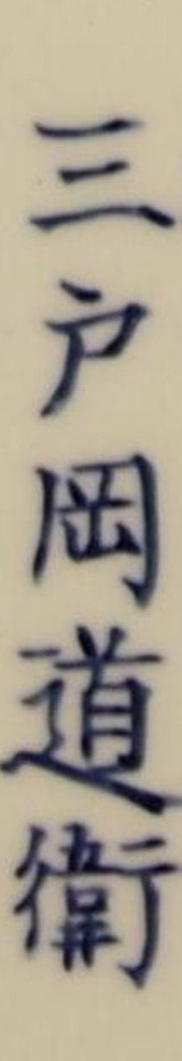三戸岡道衛
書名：A~D
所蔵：koyasan kongobuji
